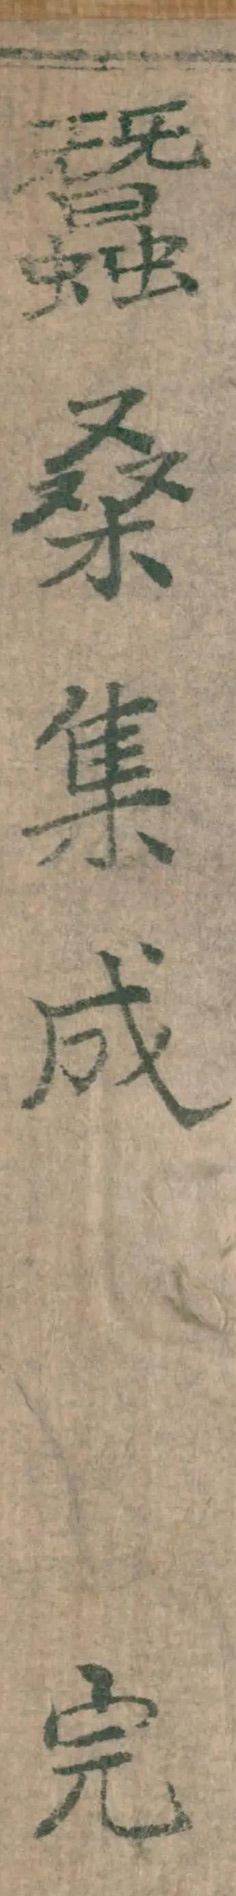蚕桑集成完

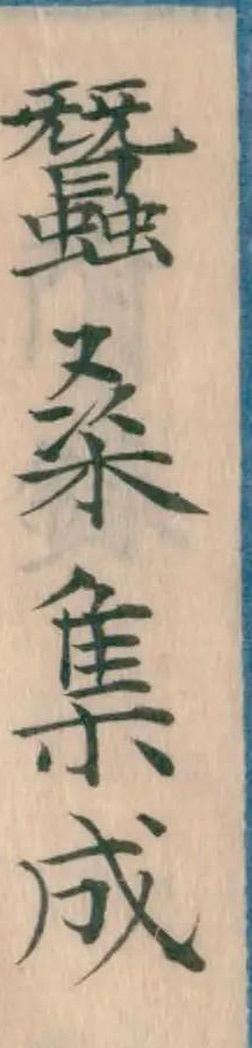蚕桑集成
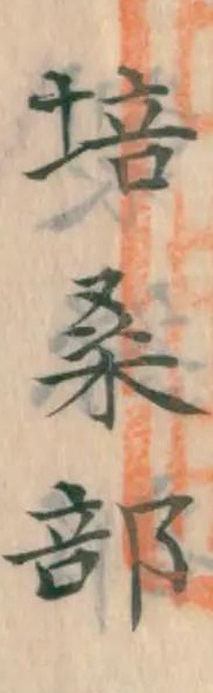培桑部
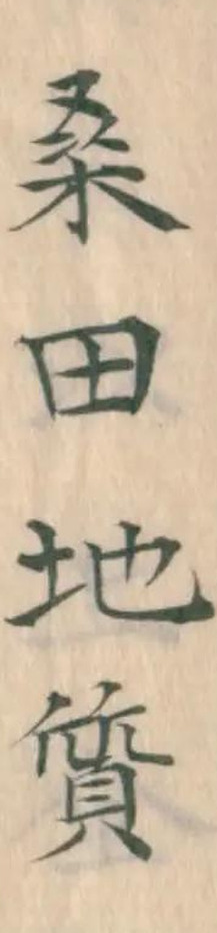桑田地質
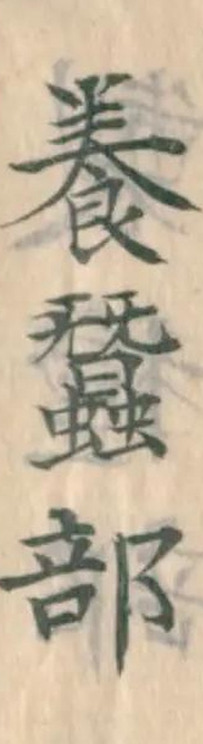養蚕部

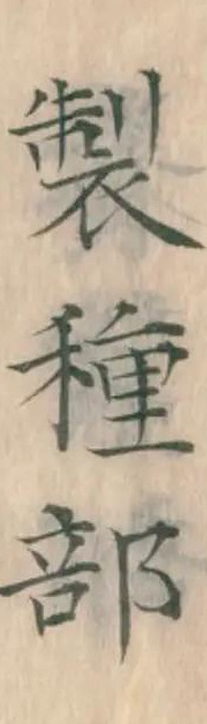製種部
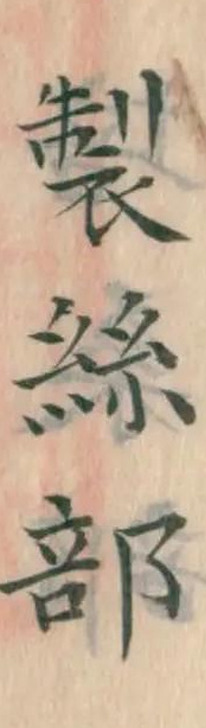製種部
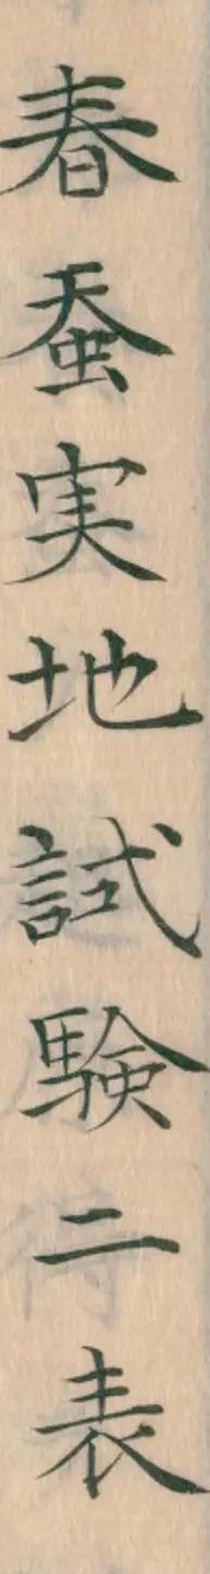春蚕実地試験二表
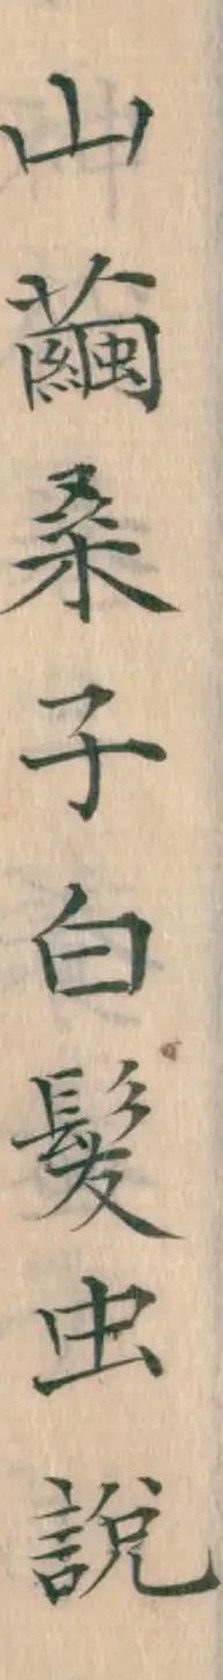山繭桑子白髪虫説
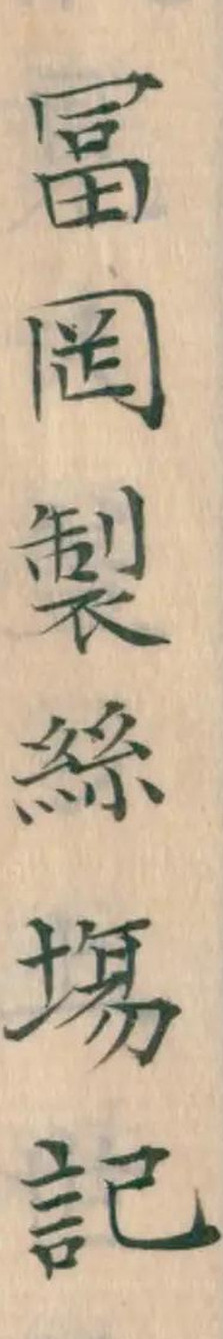富岡製糸場記

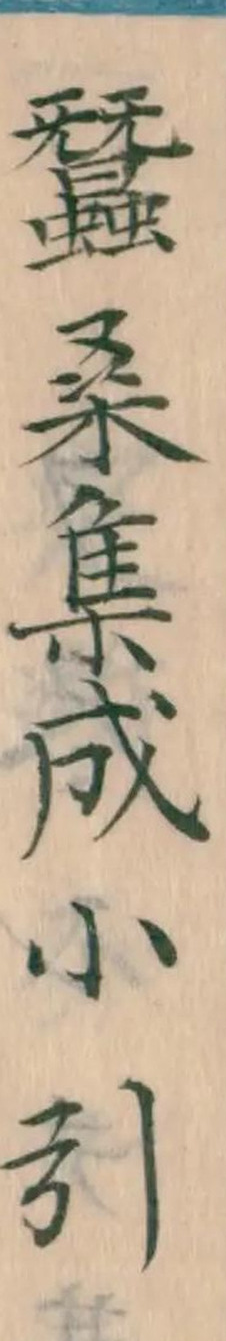蚕桑集成小引
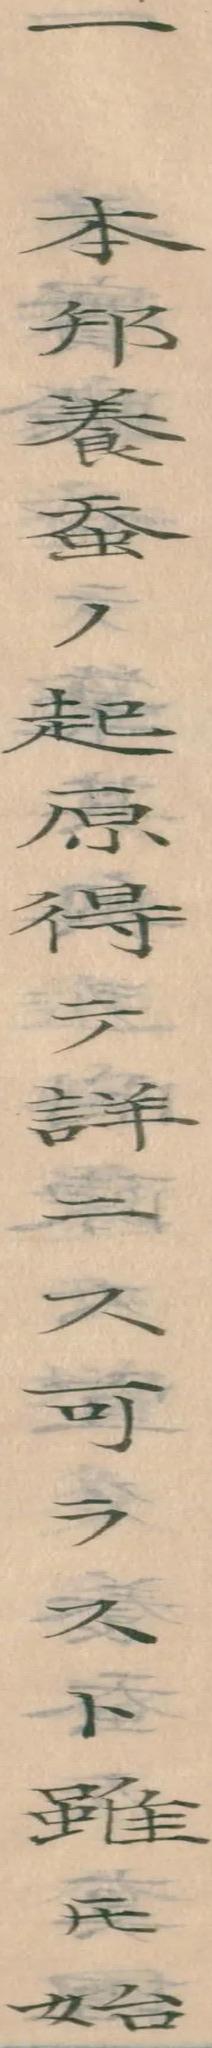一本邦養蚕ノ起原得テ詳ニス可ラスト雖トモ始
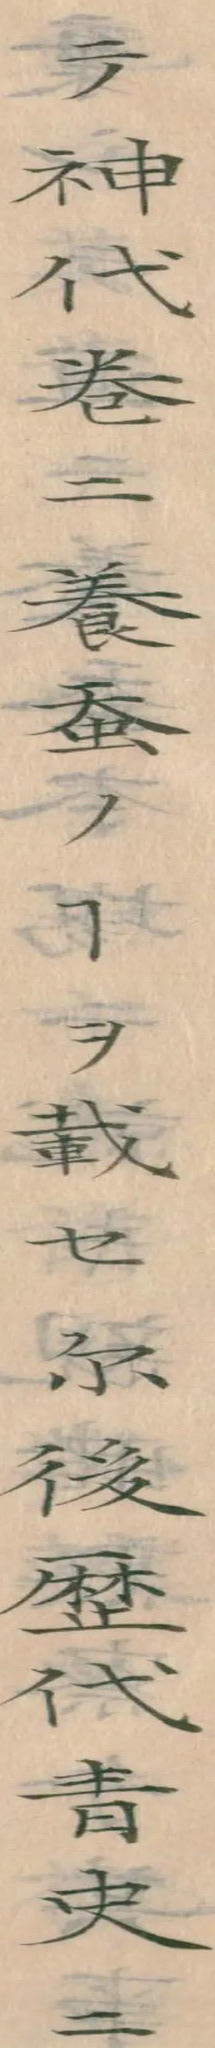テ神代巻ニ養蚕ノコトヲ載セ爾後歴代青史ニ
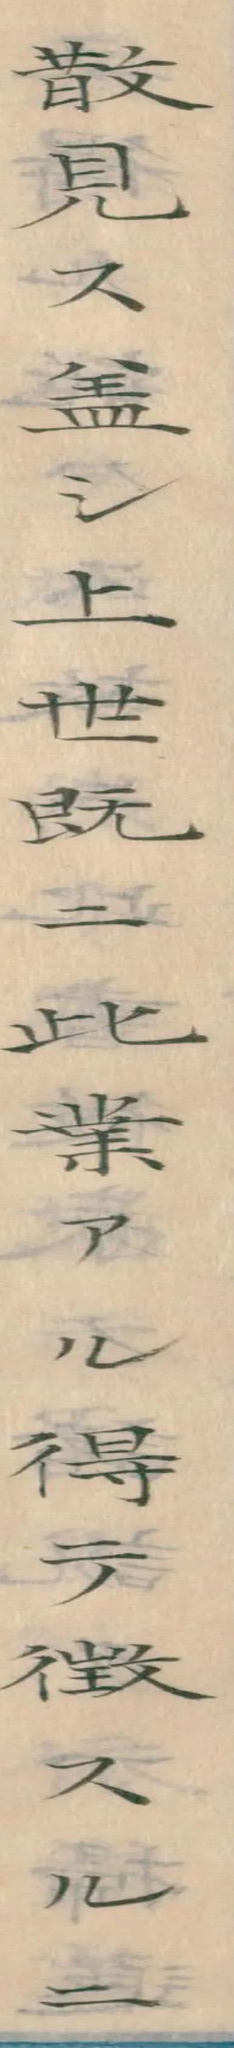散見ス蓋シ上世既ニ此業アル得テ徴スルニ
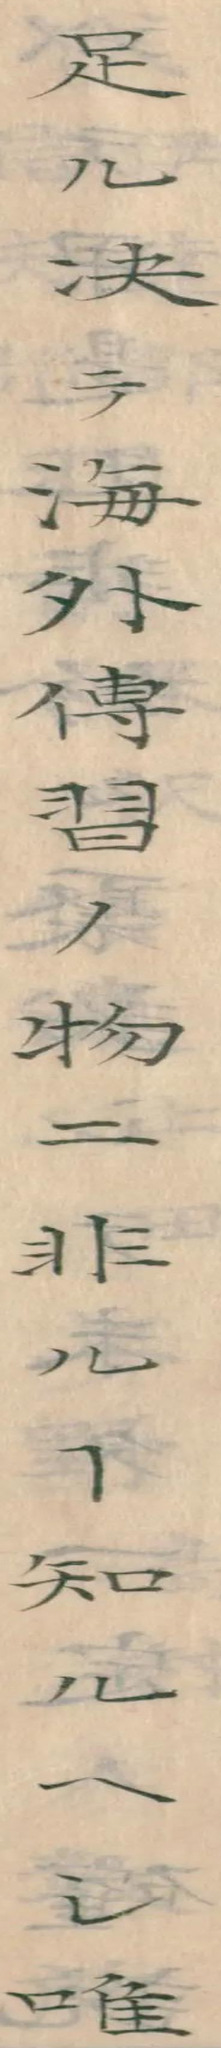足ル決テ海外伝習ノ物ニ非ルコト知ルヘシ唯
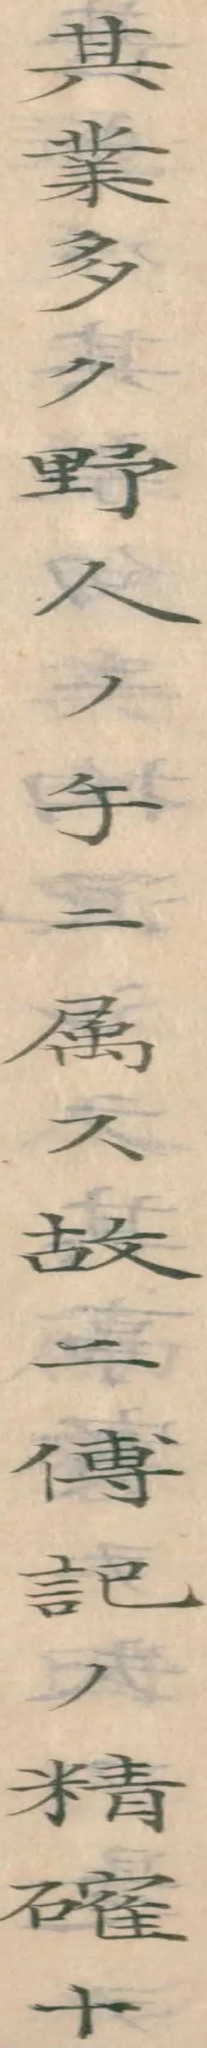其業多ク野人ノ手ニ属ス故ニ伝記ノ精確ナ
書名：蚕桑集成
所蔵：国立国会図書館 National Diet Library, JAPAN
